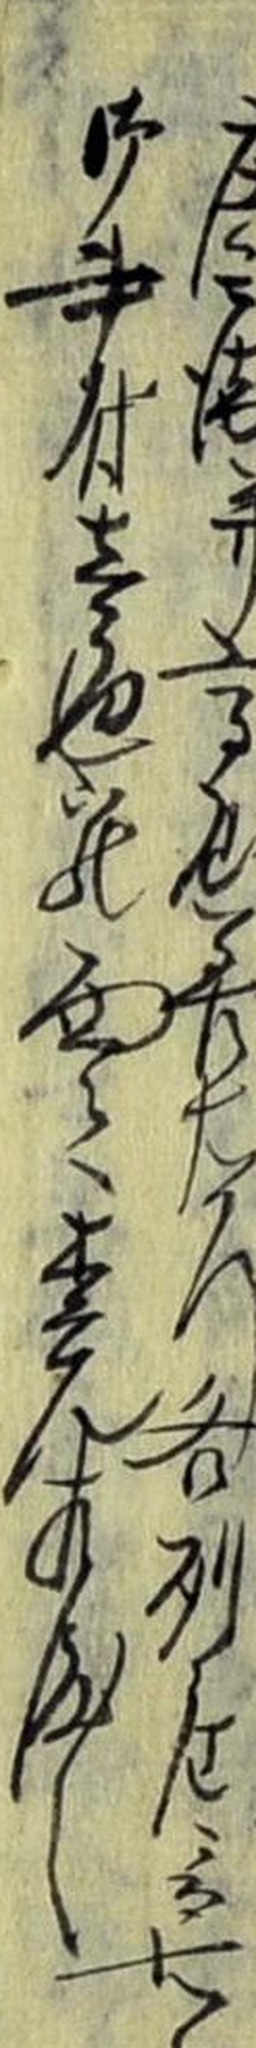御書付壱通宛面々へ木工允相渡候

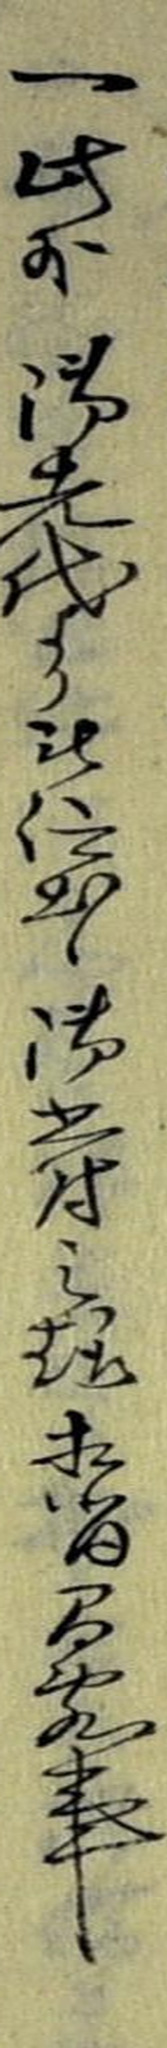一此外御先代より被仰出候御書付之趣相背間敷事
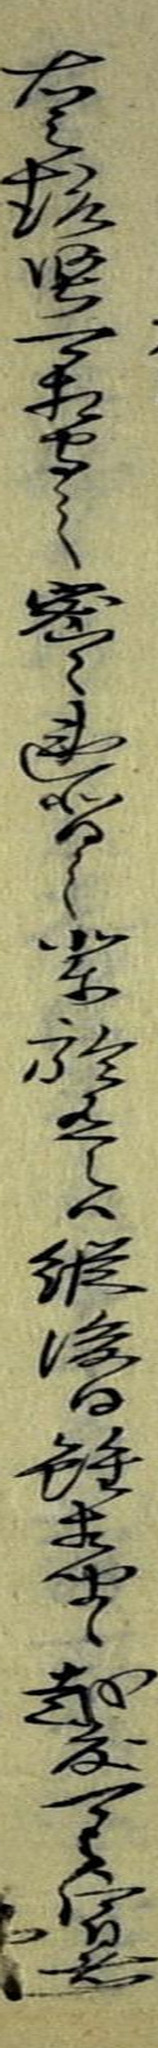右之趣堅可相守之密々違背之輩於有之ハ縦後日雖相聞候越度可被仰付者也
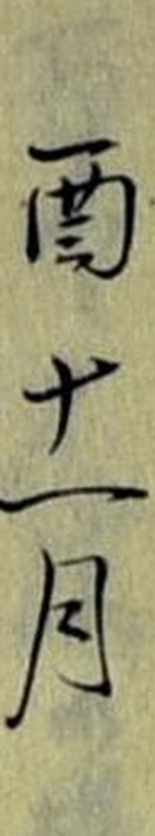酉十一月
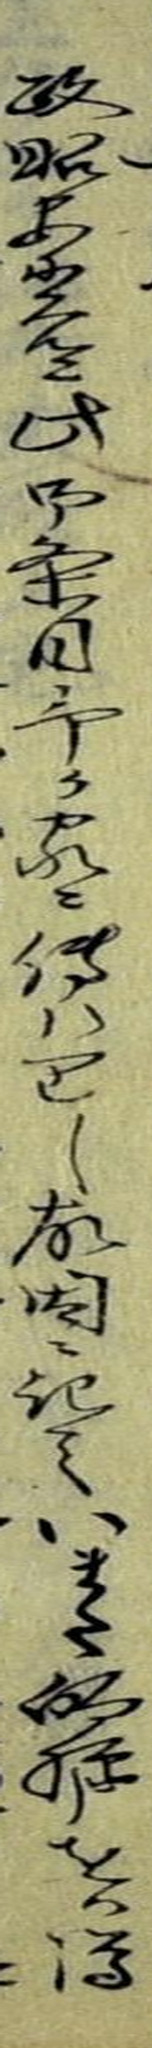政昭案スルニ此御条目予か家ニ伝ハりし故因ニ記之いまた的拠をハ得
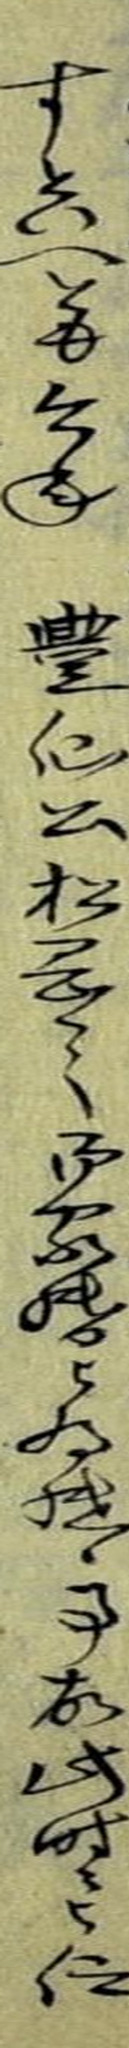すといへとも今年豊仙公松岡之御家督被為継候事故此時ニ被仰
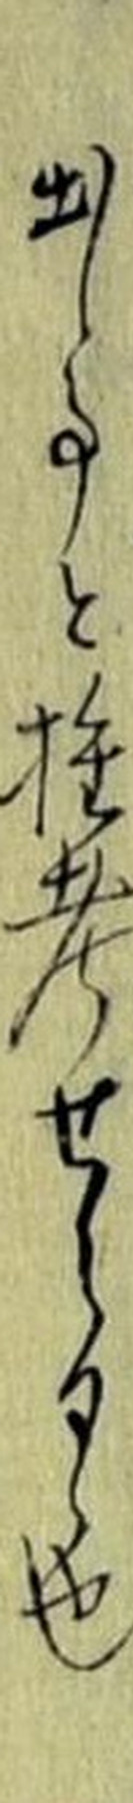出候事と推考せらるゝ也
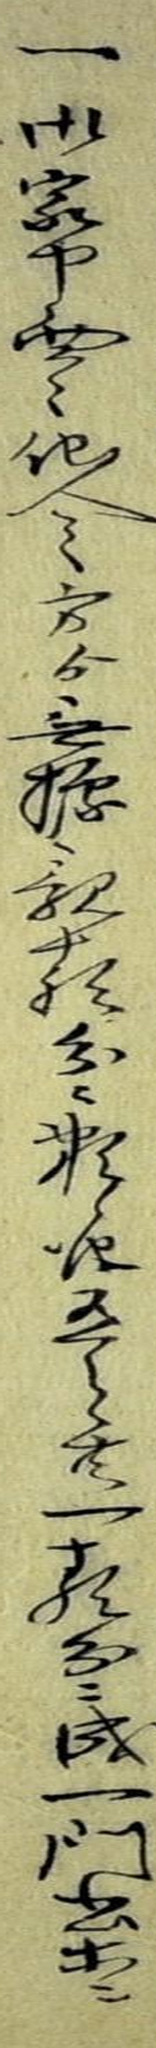一御家中面々他人之方ゟ無拠親類分ニ頼候儀有之候共一類分ニ成一門書等ニ
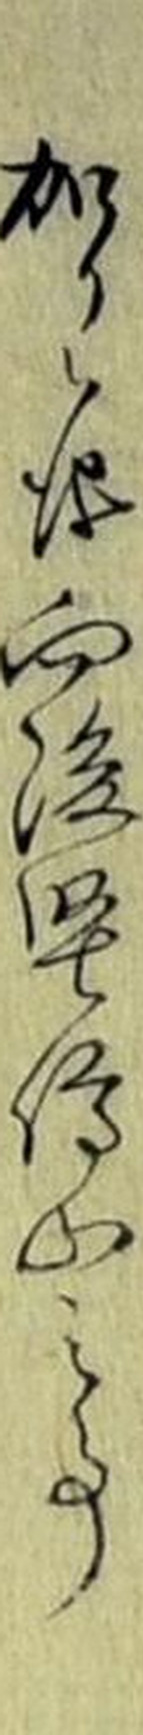加り候儀向後堅停止之事
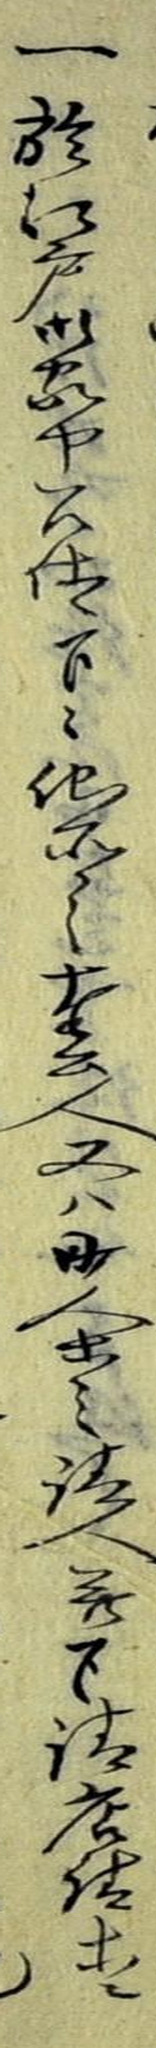一於江戸御家中召仕候下々他所之奉公人又ハ町人等之請人并下請店請等ニ
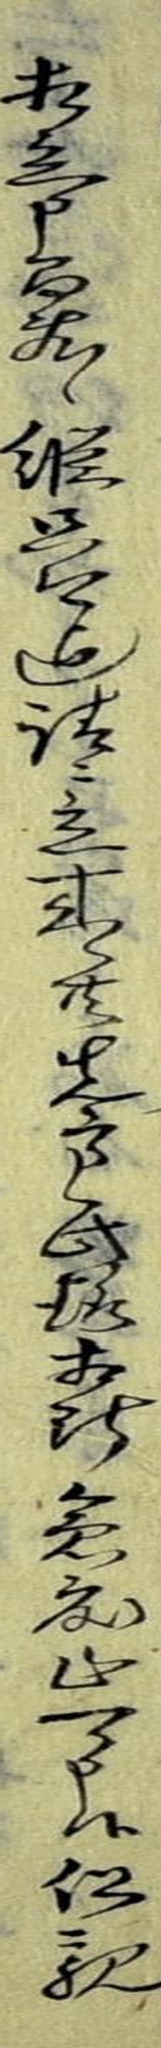相立申間敷候縦只今迄請ニ立来候共先方へ此趣相断急度止可申候但親
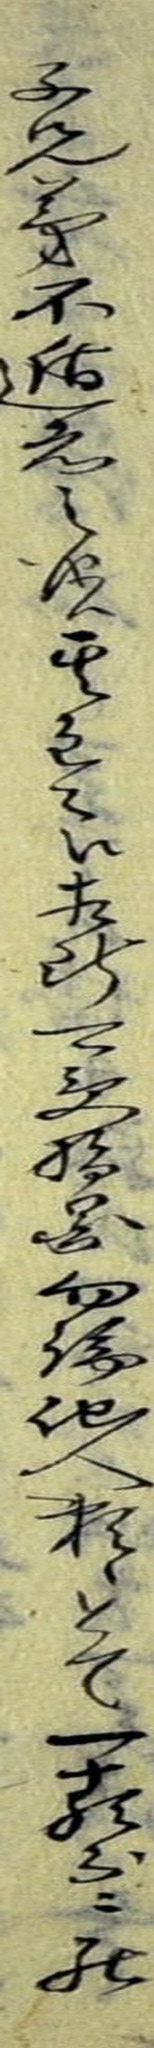子兄弟不遁者之儀ハ其主々江相断可受指図勿論他人頼候とて一類分ニ罷
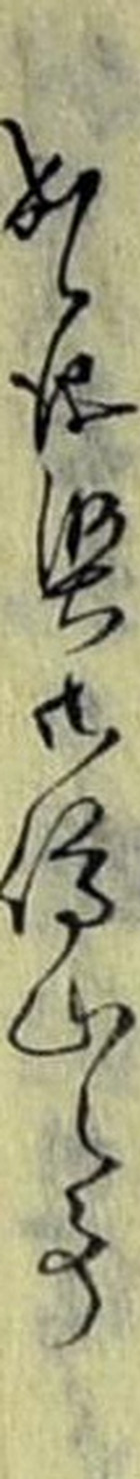成候儀堅御停止之事
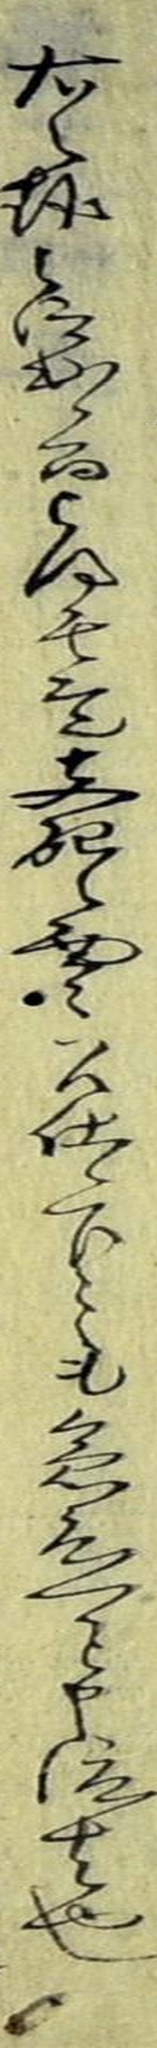右之趣被仰出候間被得其意支配之面々召仕候下々も急度可被申渡者也
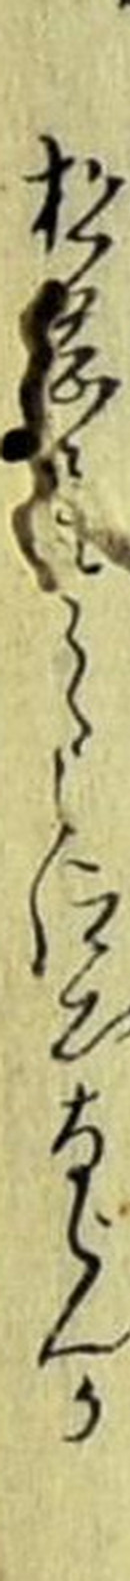松岡ニて之被仰出ならんか

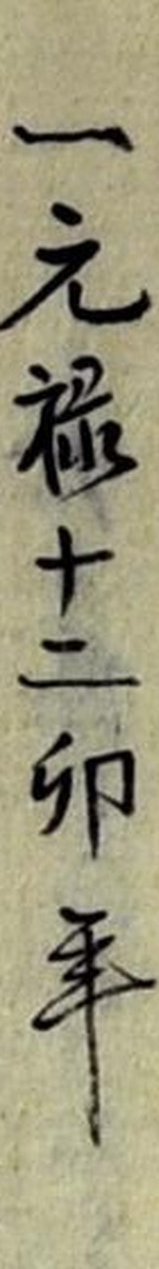一元禄十二卯年
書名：命令之部 一
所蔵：福井県文書館 Fukui Prefectural Archives
